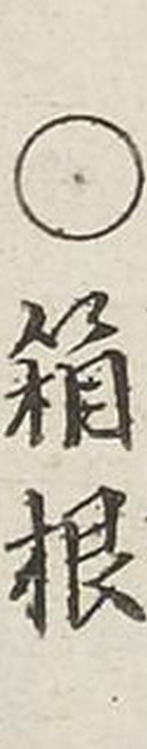○箱根
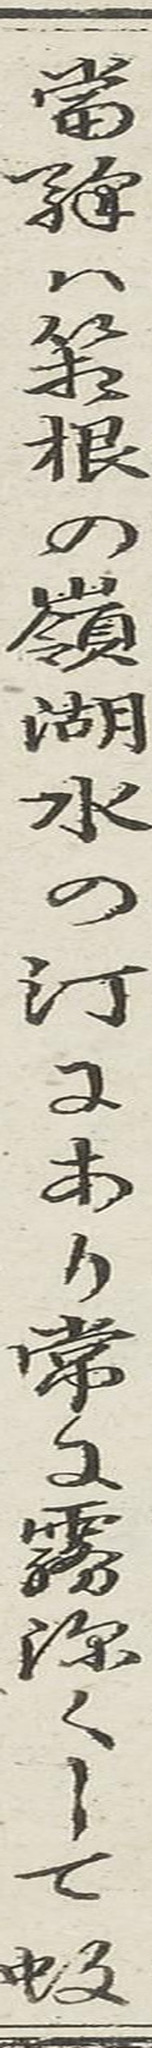當驛は箱根の嶺湖水の汀にあり常に霧深くして蚊
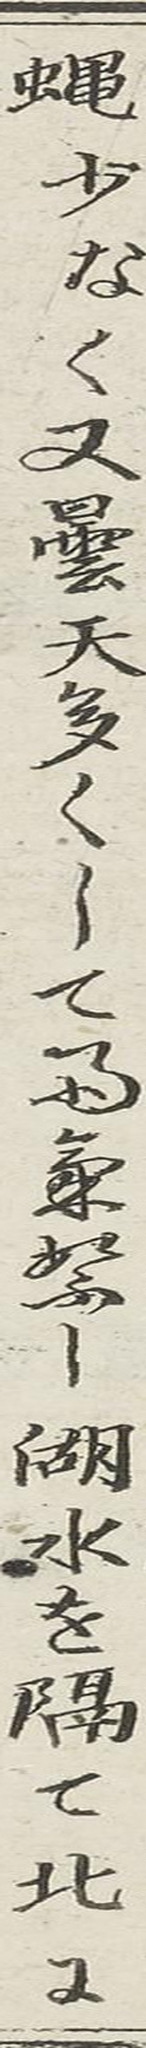蝿少なく又曇天多くして雨氣繁し湖水を隔て北に
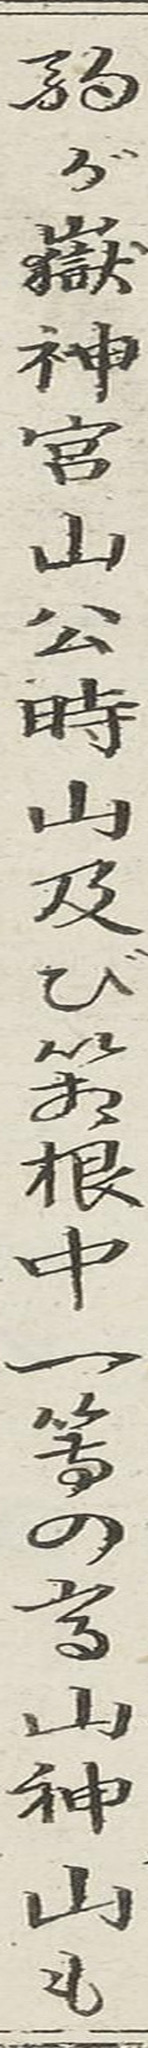駒が嶽神宮山公時山及び箱根中一等の高山神山も
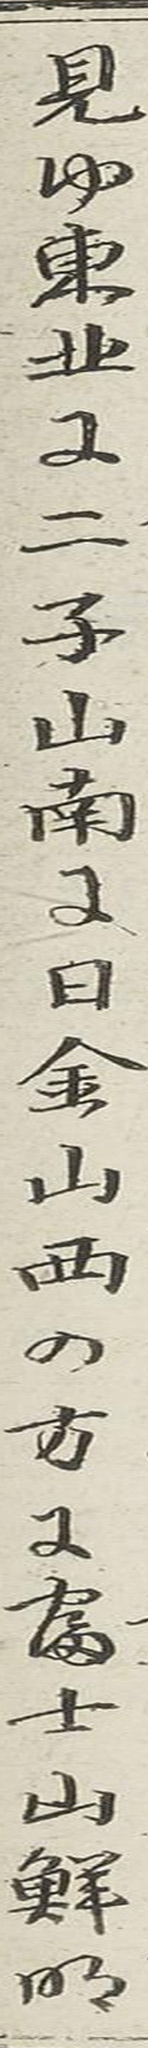見ゆ東北に二子山南に日金山西の方に富士山鮮明
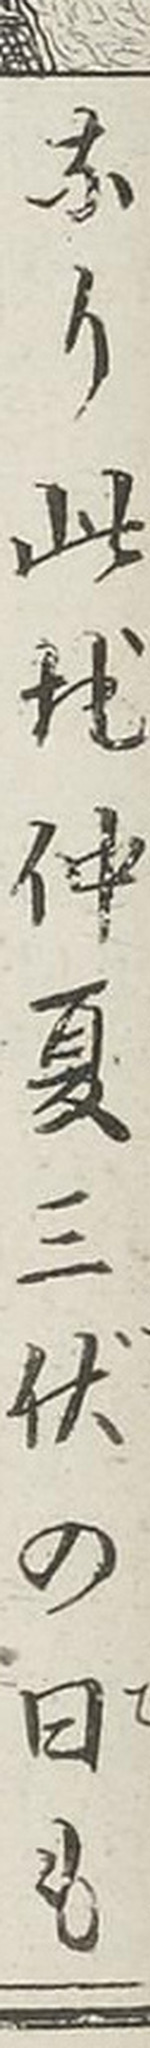なり此地仲夏三伏の日も
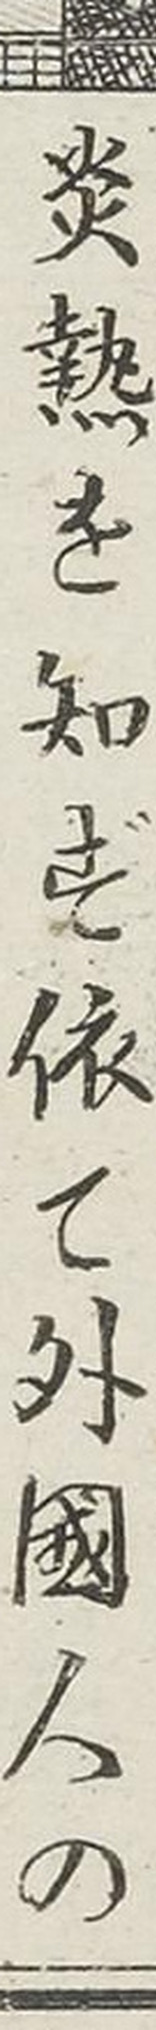炎熱を知ず依て外国人の
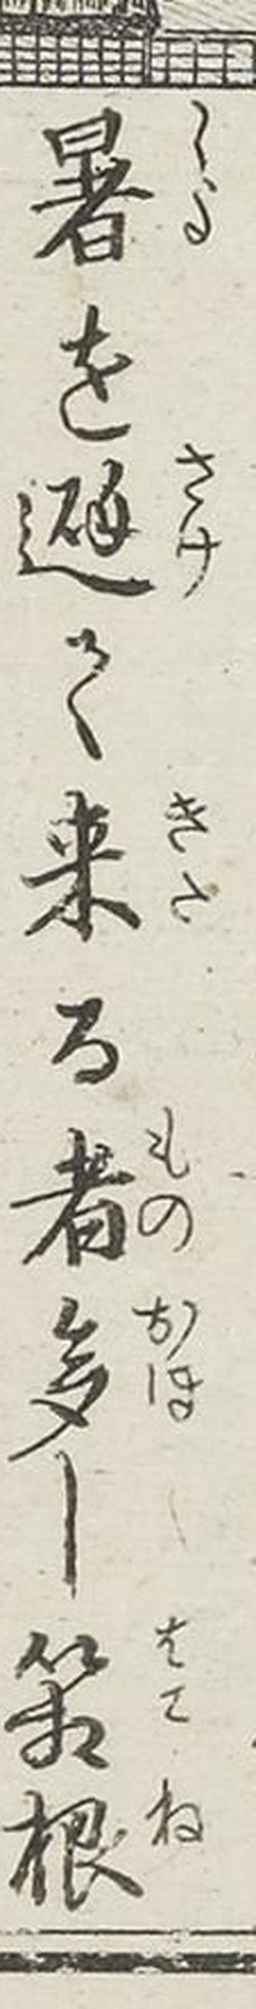暑を避て来る者多し箱根
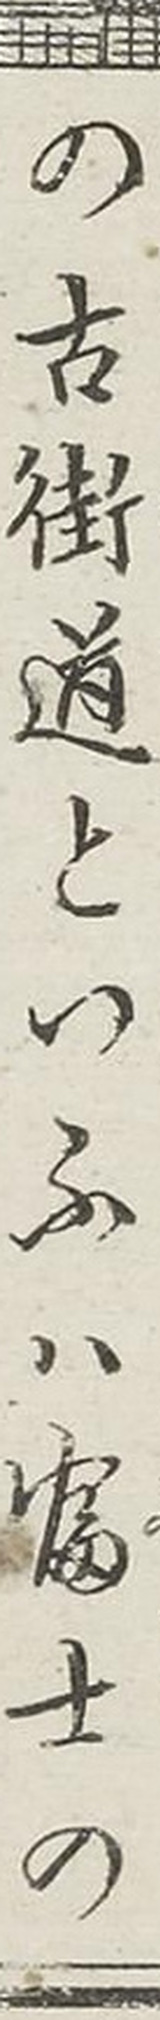の古街道といふは富士の
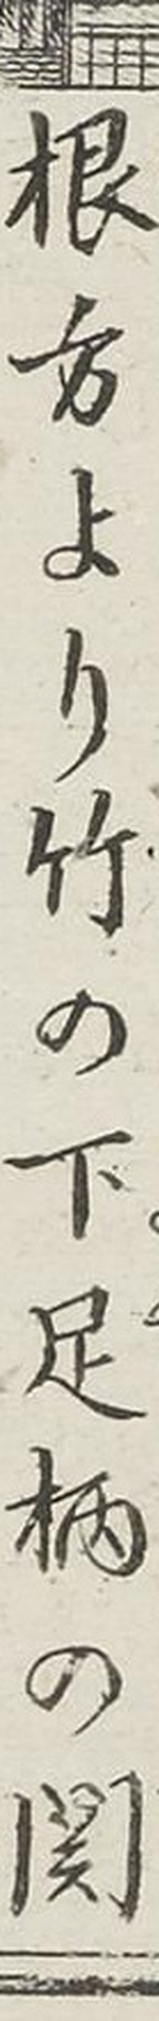根方より竹の下足柄の関
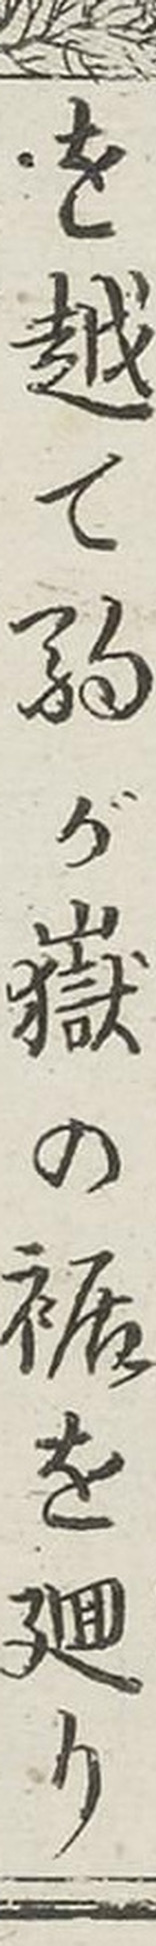を越て駒が嶽の裾を廻り
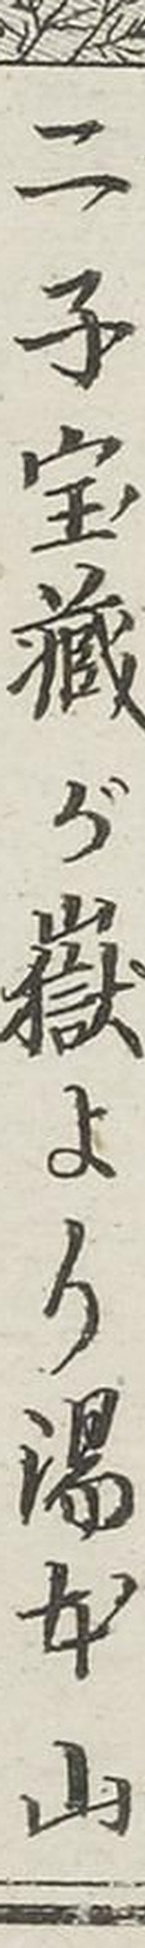箱二子宝蔵が嶽より湯本山
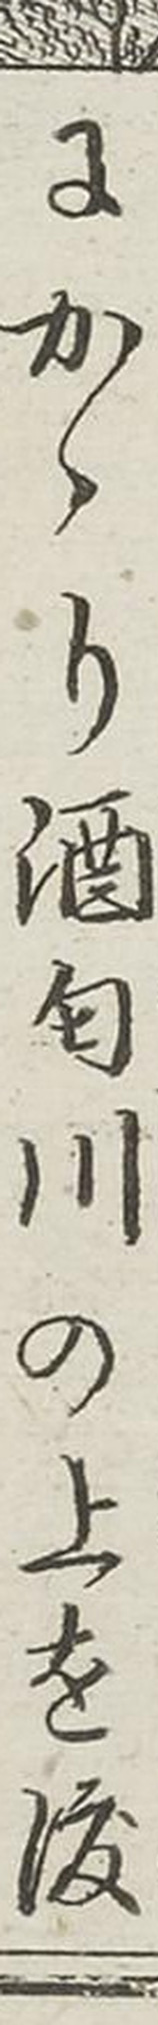根にかゝり酒匂川の上を渡
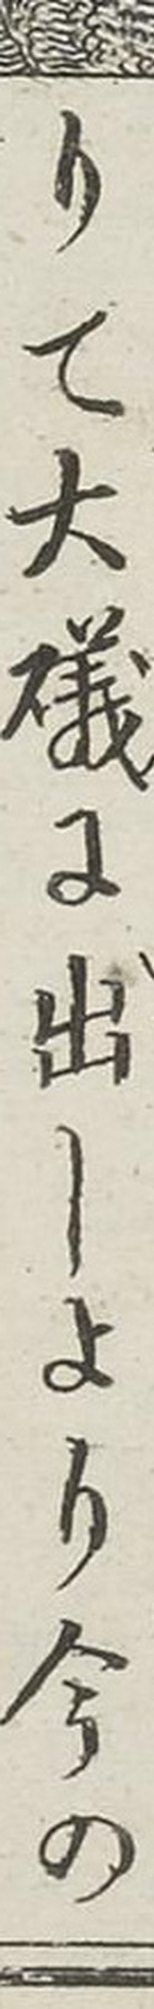圖りて大磯に出しより今の
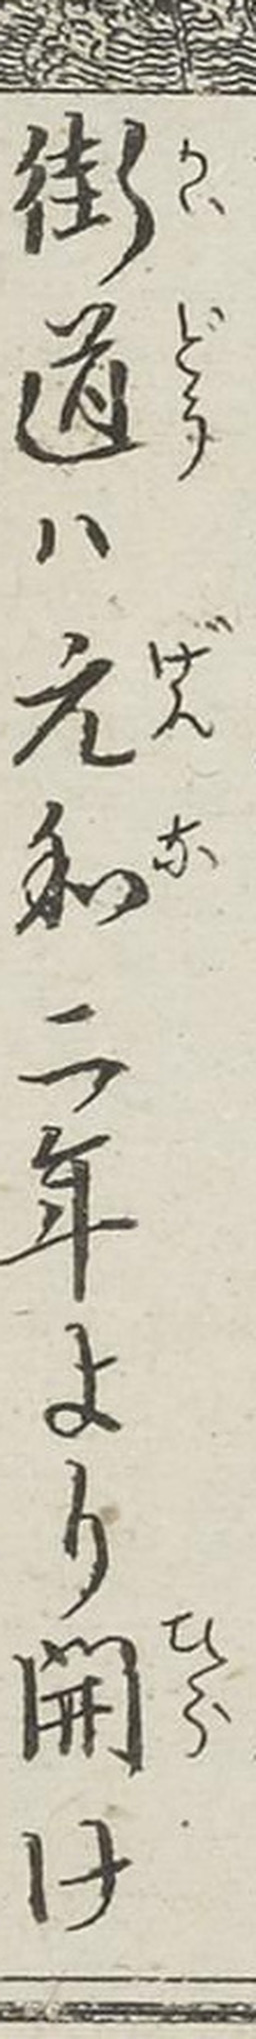街道は元和二年より開け

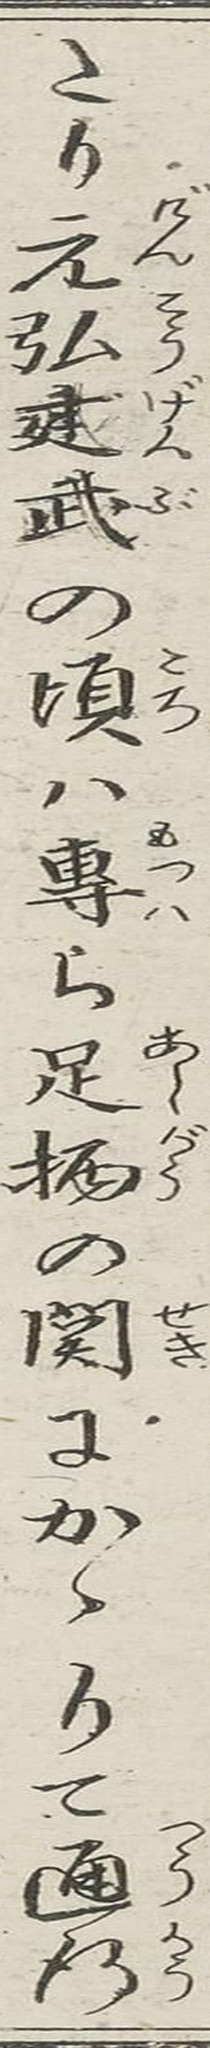たり元弘建武の頃は専ら足柄の関にかゝりて通行
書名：箱根温泉誌　全
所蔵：東京大学地震研究所図書室 Earthquake Research Institute Library, The University of Tokyo, JAPAN
